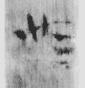{廿二}
